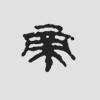帝
